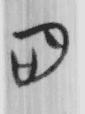名
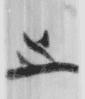之
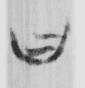曰
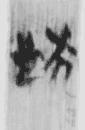幸
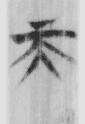天
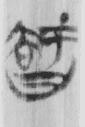智
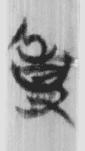事
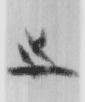之
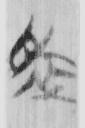卒B
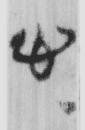心
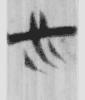必
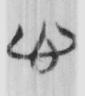心
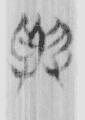與
